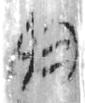於
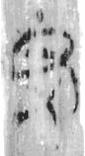夬
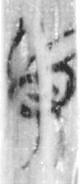○（亡）
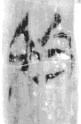於
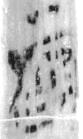晨
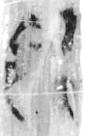即
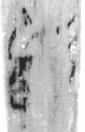○（亡）
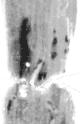於
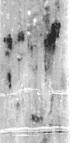巳
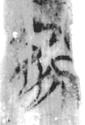衰
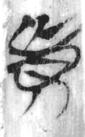○（亡）
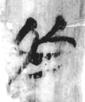於
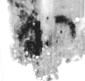午
